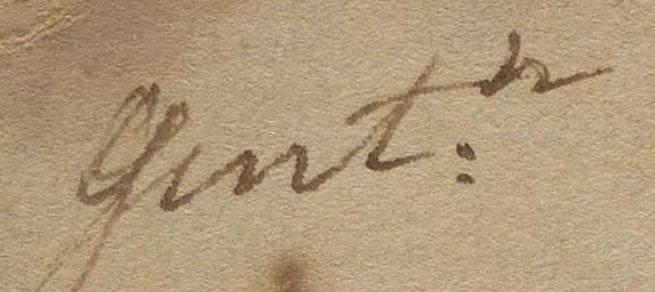Gent^n
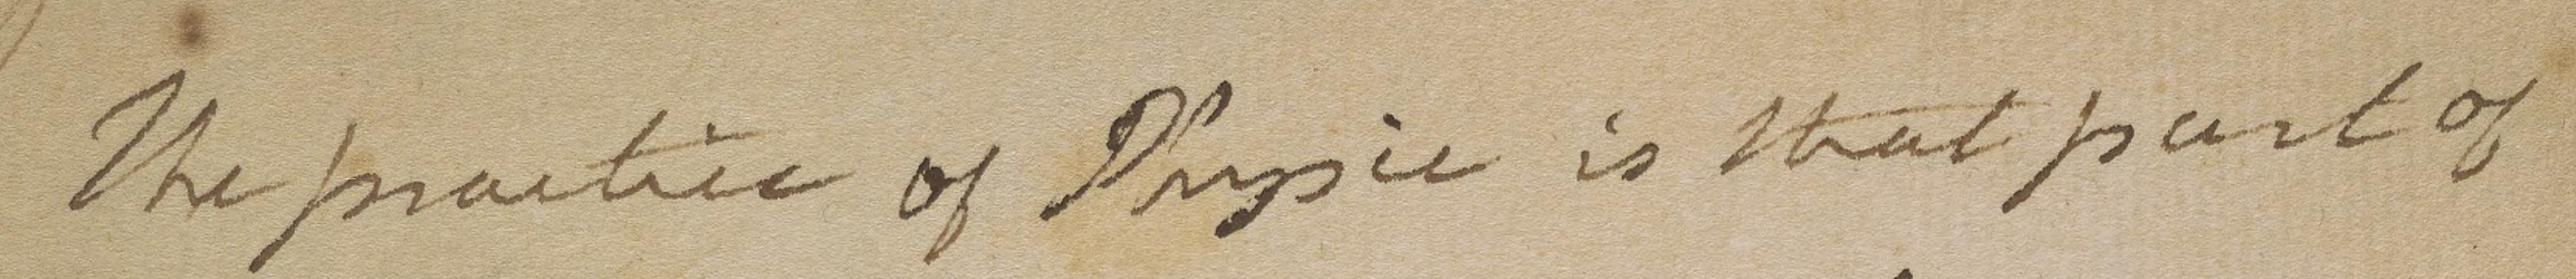The practice of Physic is that part of
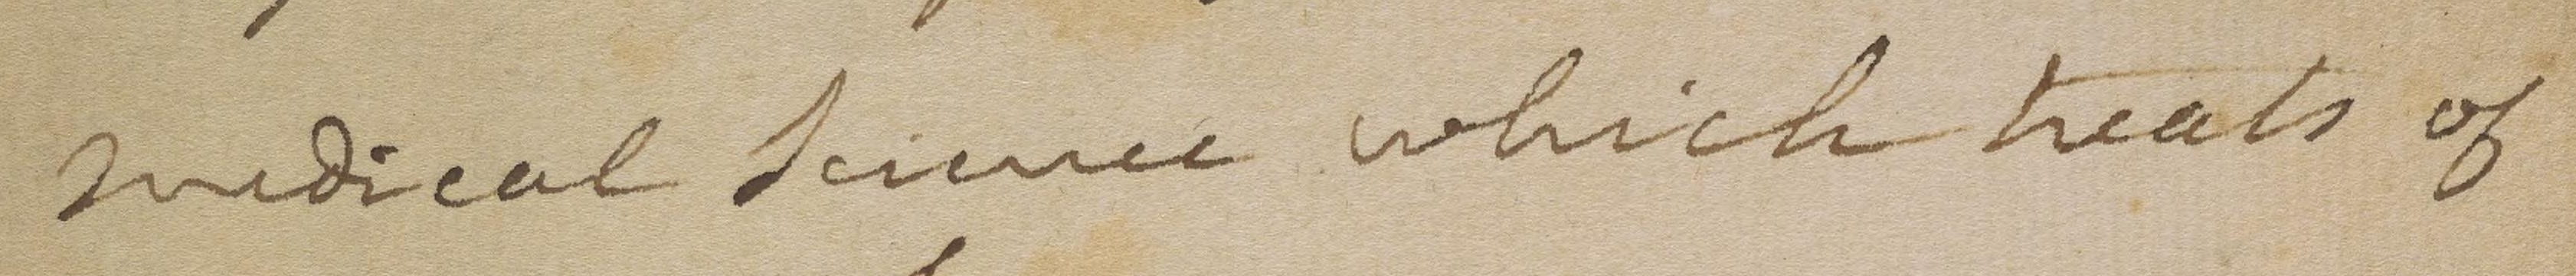medical science which treats of
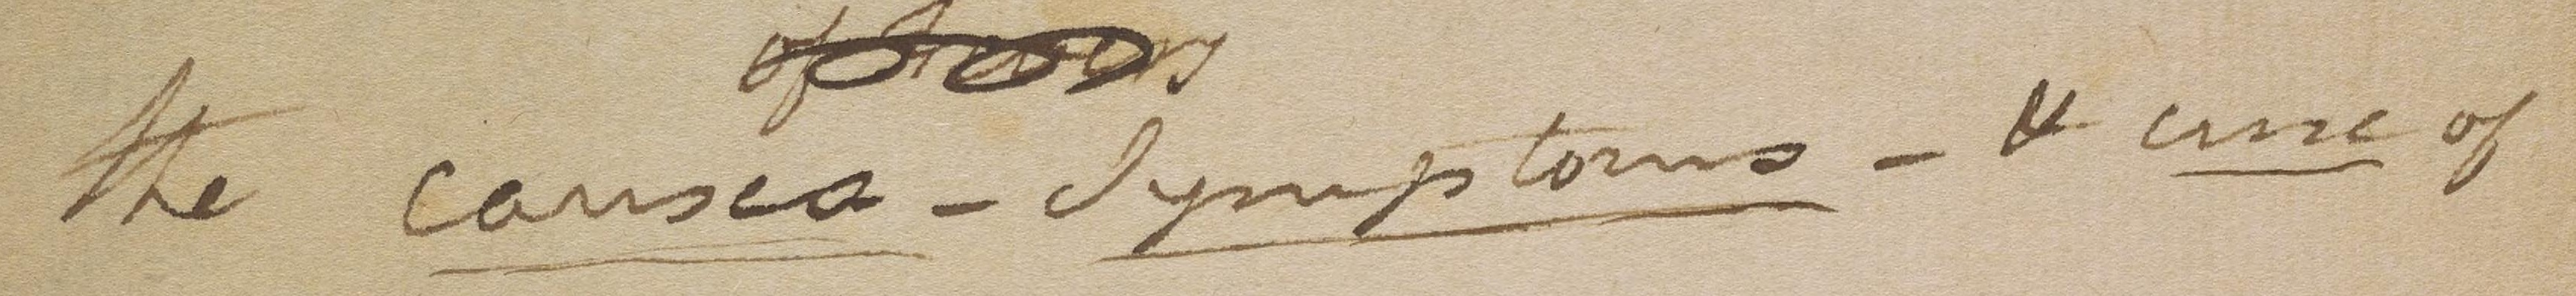the causes- symptoms- and cure of
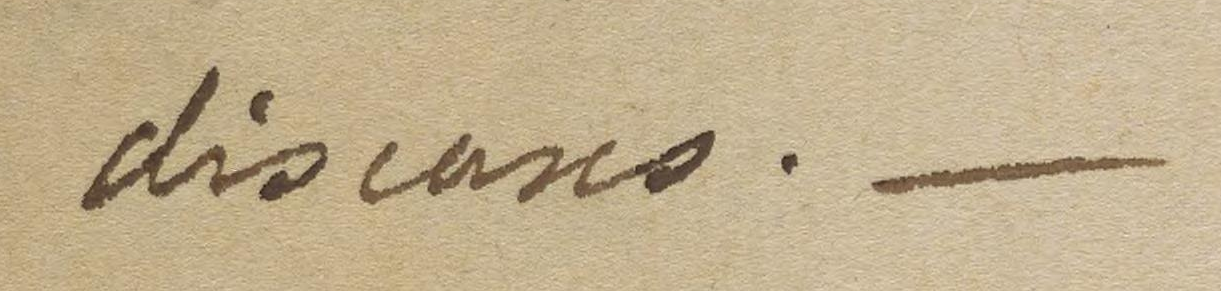diseases.-
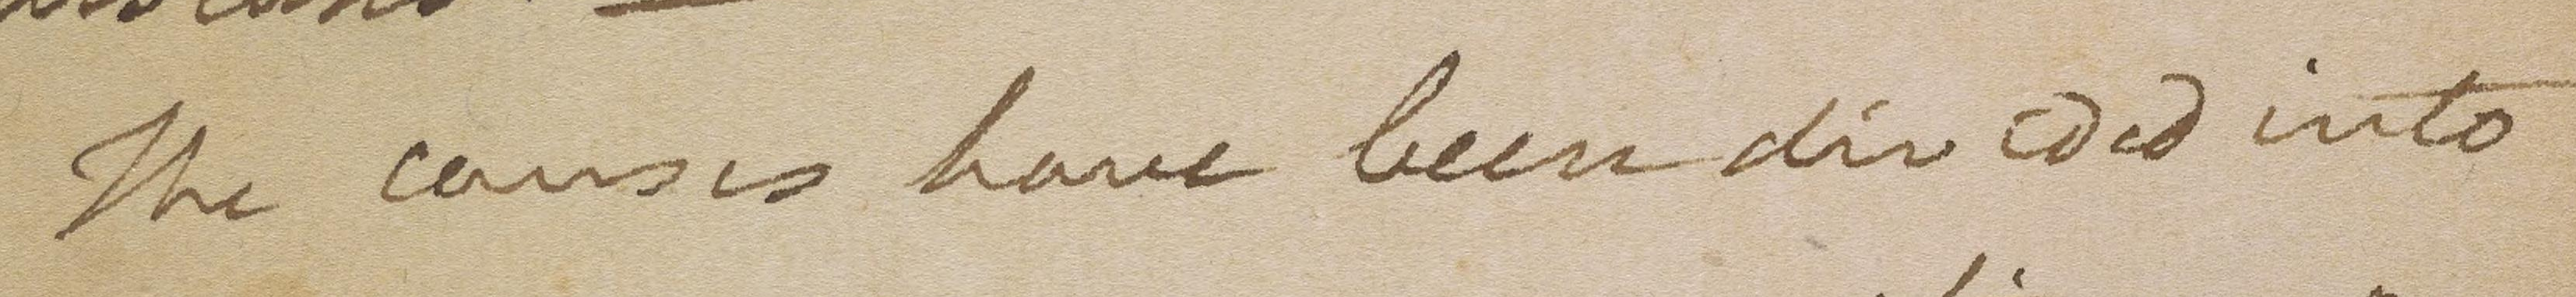The causes have been divided into
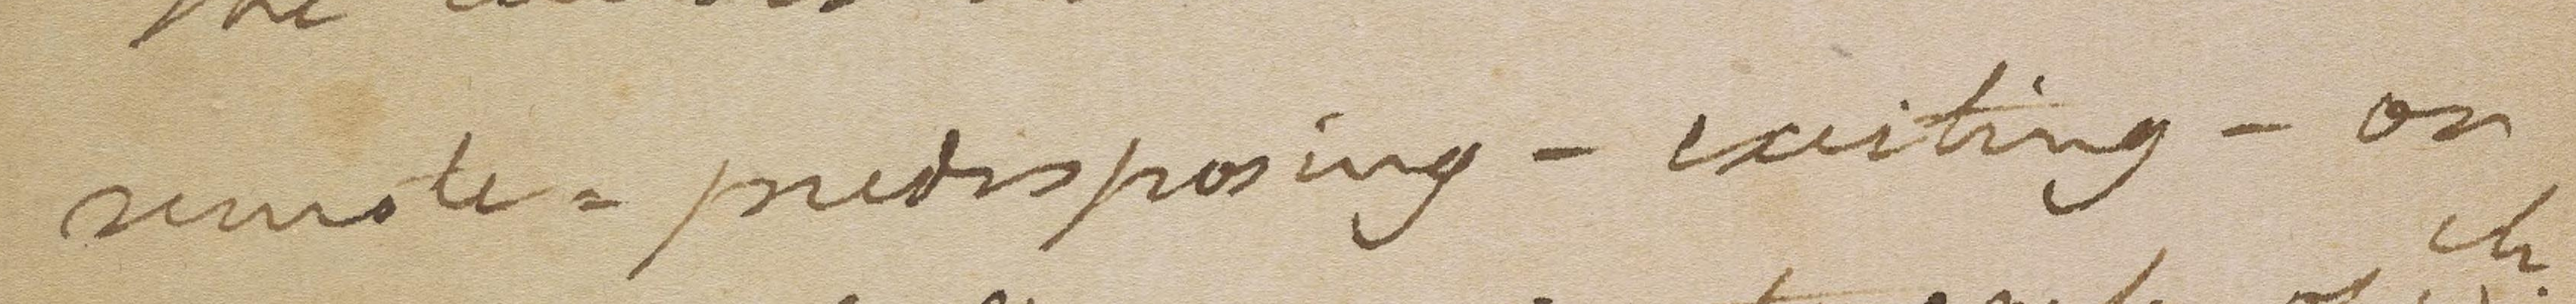remote- predisposing- exciting- or
